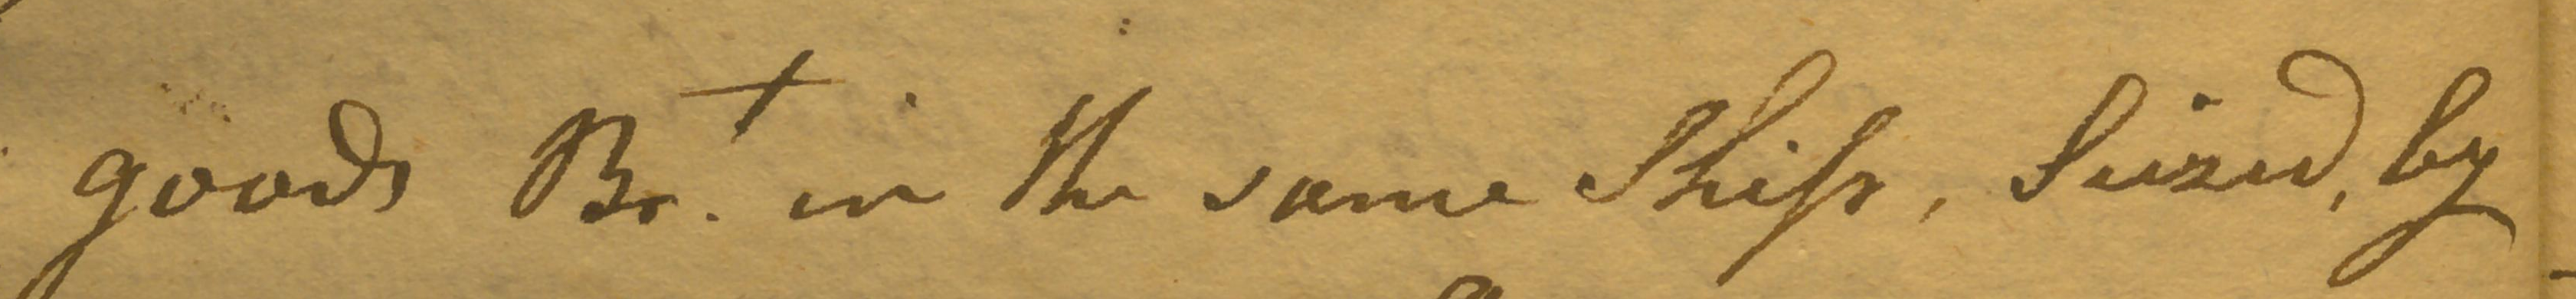goods Br^t. in the same Ships, seized by
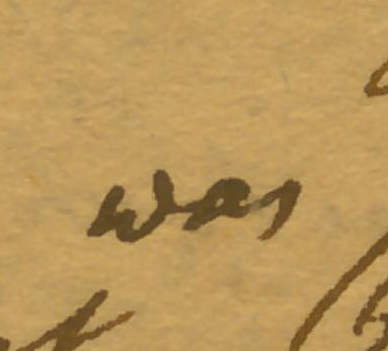was
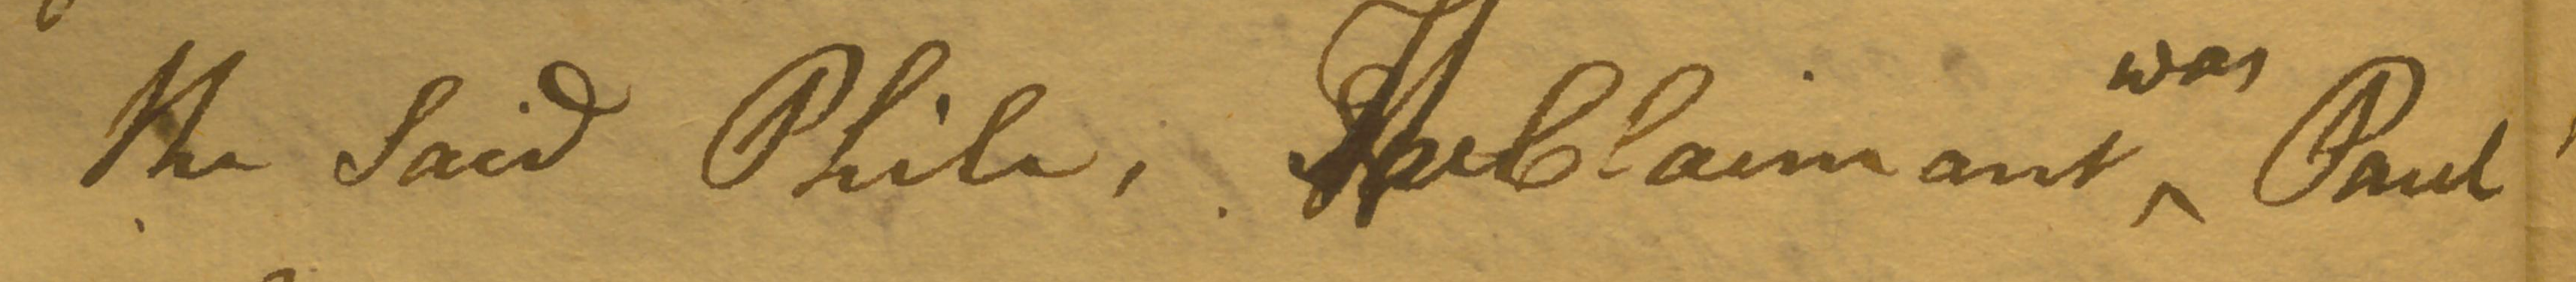the Said Phile, The Claimant ^ Paul
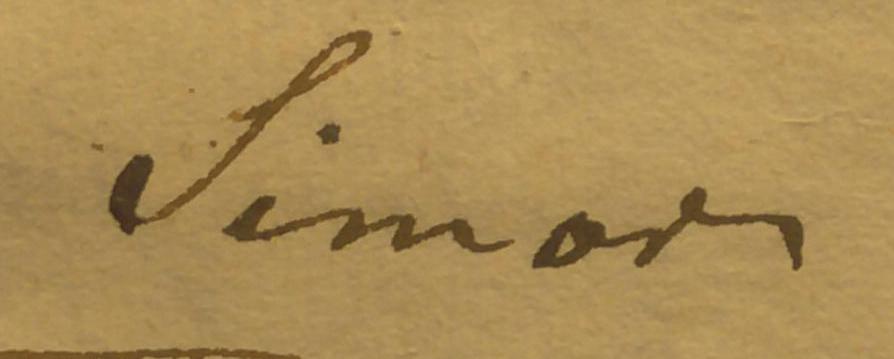Simon
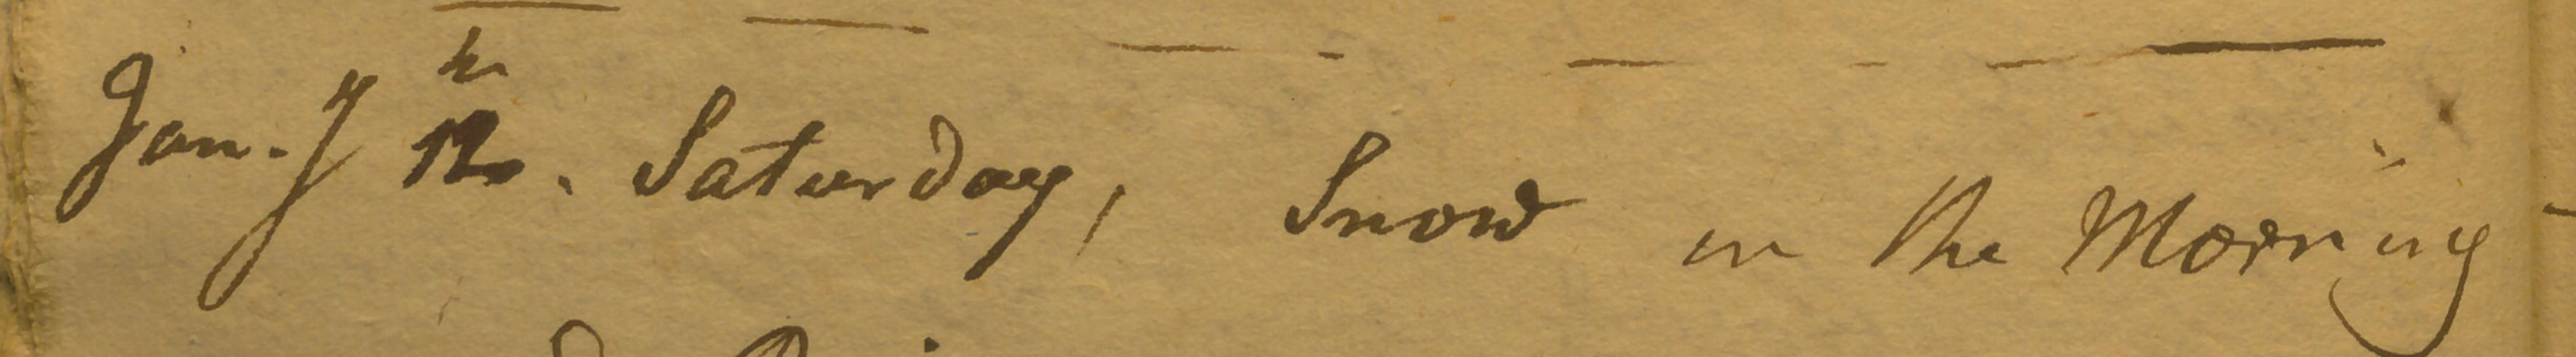Jan^y. 12^th. Saturday, Snow in the Morning
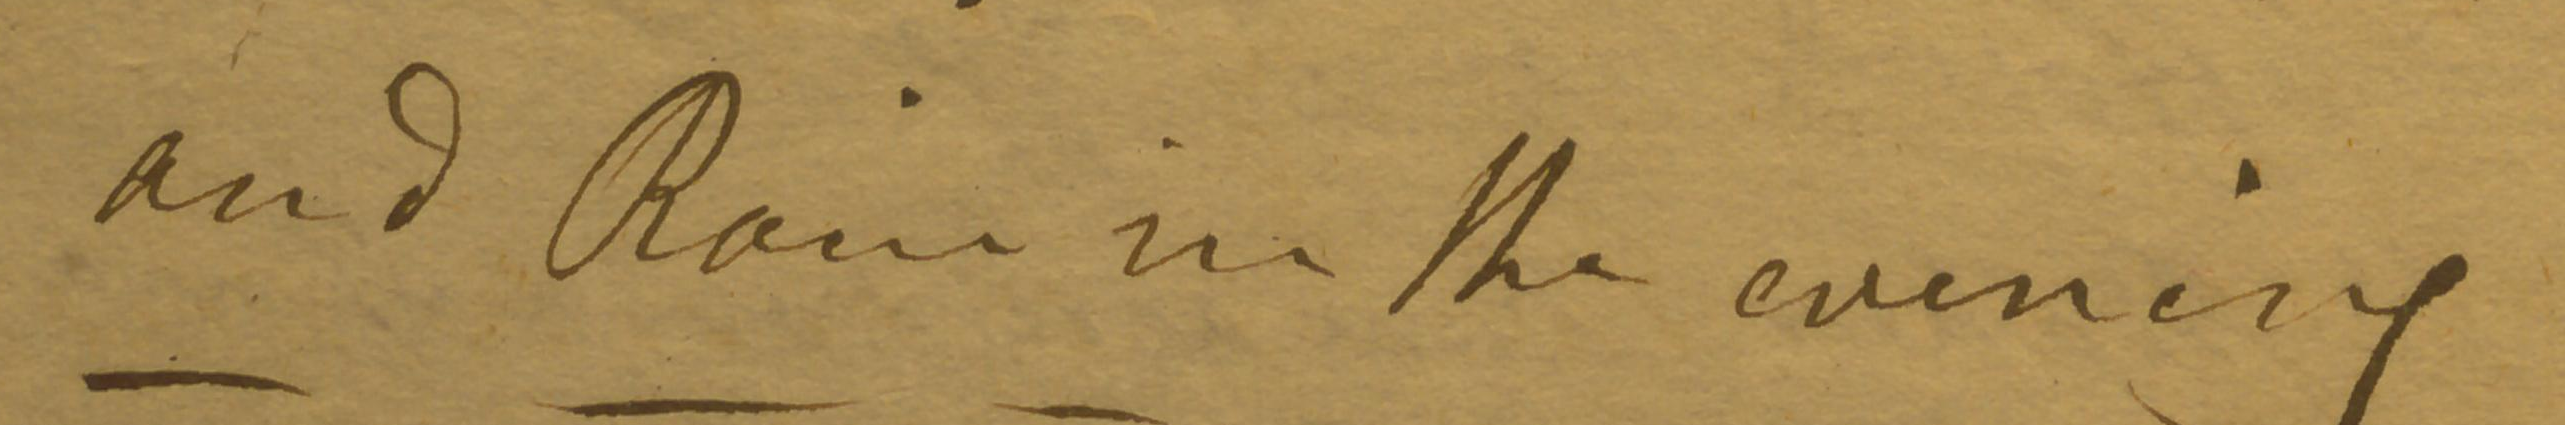and Rain in the evening
